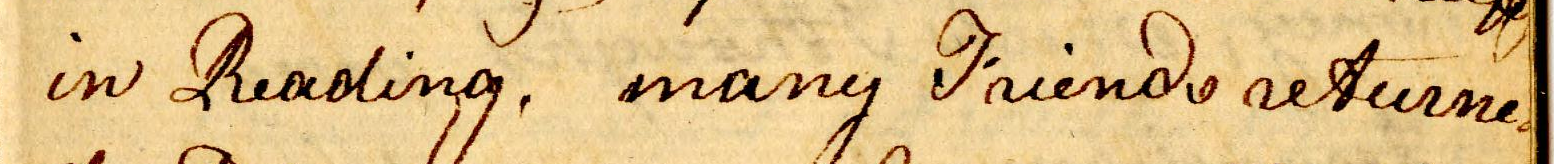in Reading, many Friends returne
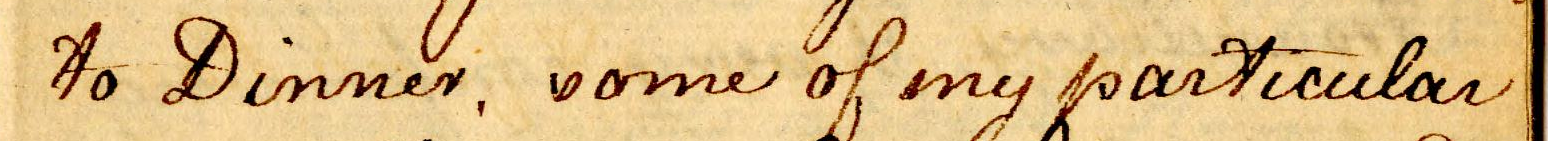to Dinner, some of my particular
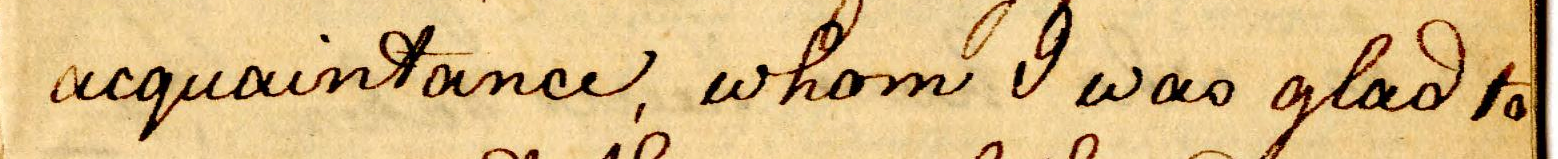acquaintance, whom I was glad to
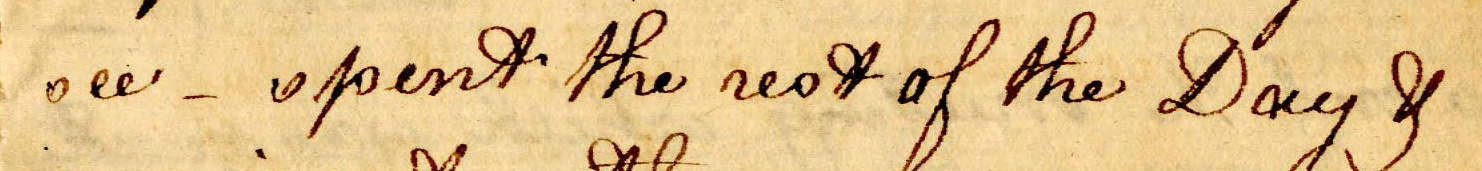see- spent the rest of the Day &
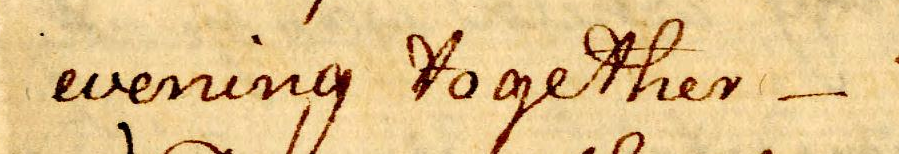evening together-
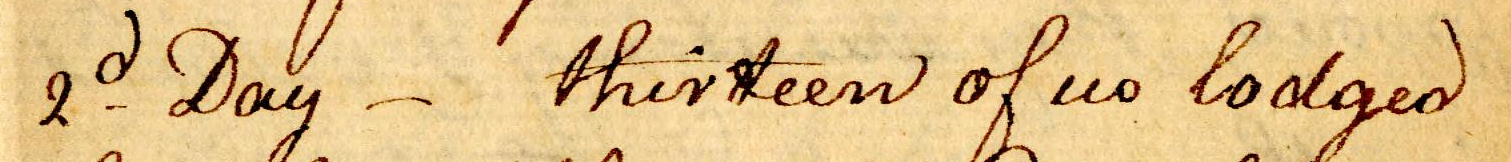2^d Day- thirteen of us lodged
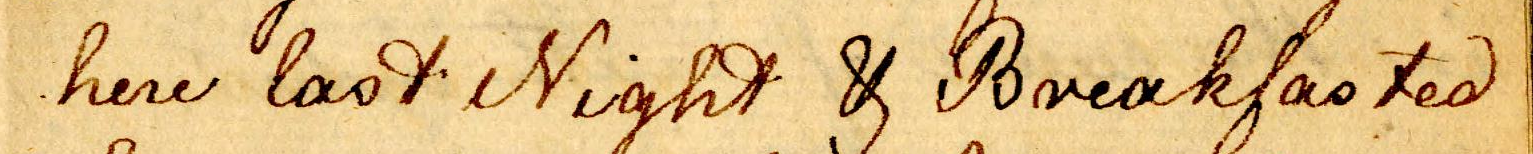here last Night & Breakfasted
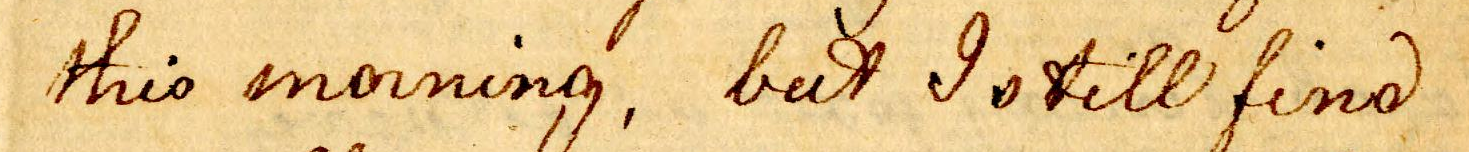this morning, but I still find
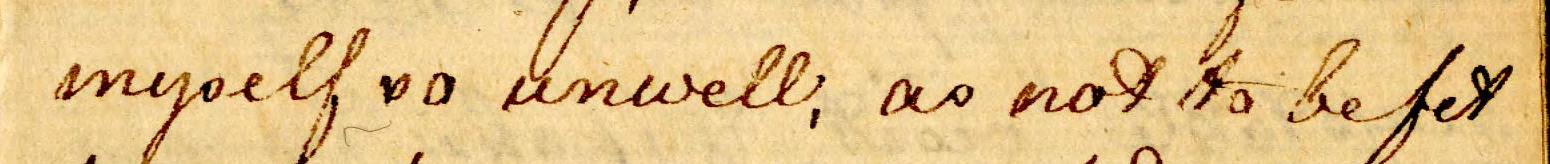myself so unwell, as not to be fit,
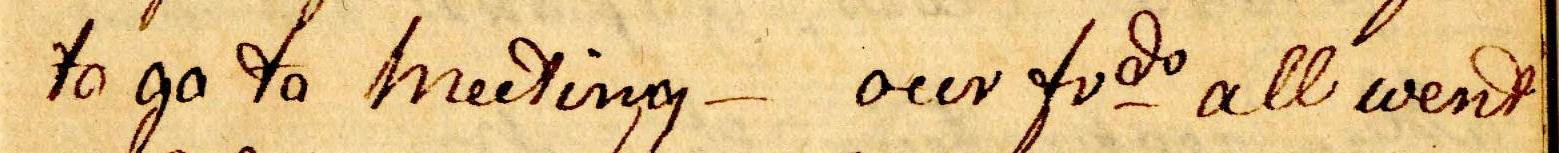to go to Meeting- our fr^ds all went
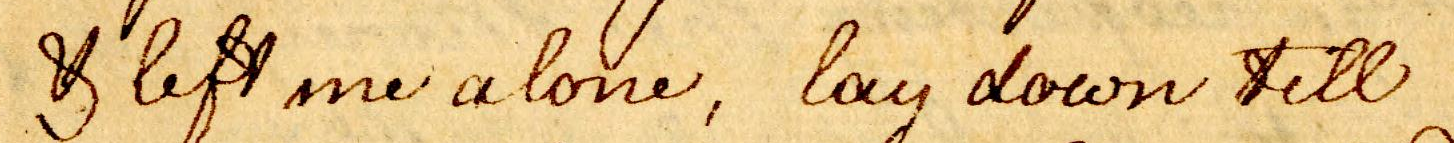& left me alone, lay down till
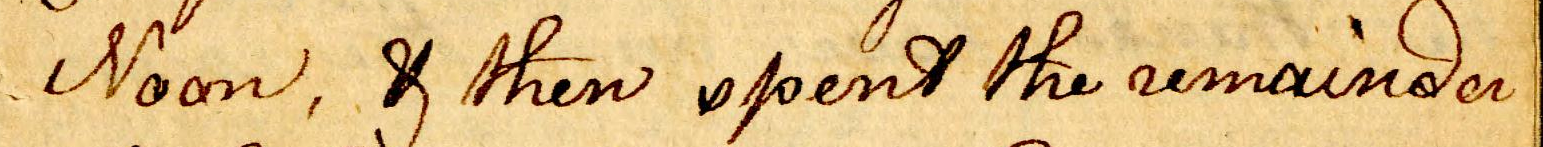Noon, & then spent the remainder
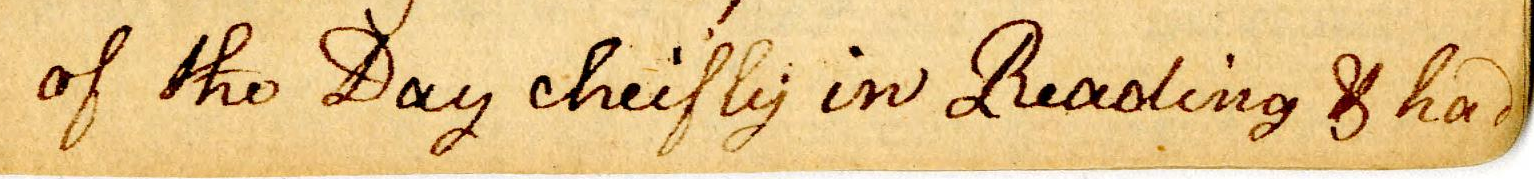of the Day cheifly in Reading & had
